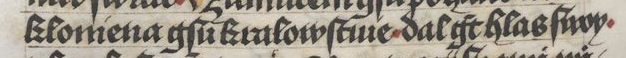kloniena gſu kralowſtuíe.dal ḡt hlas ſwoy.
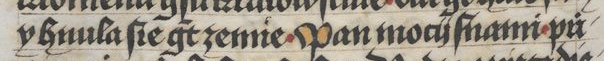y hnula ſie ḡt zemie.Pan mocij ſnami.pṙi¬
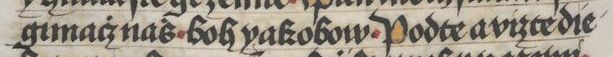gimacż naṡ.boh yakobow.Podte a vizte die¬
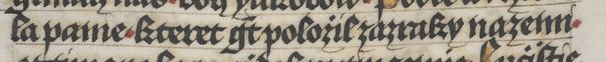la panie.kteret ḡt polożil zazraky nazemi.
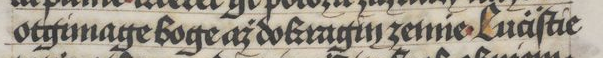otgimage boge aż dokragin zemie.Luċiẛtie
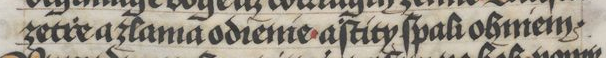zetṙe a žlama odieníe.aẛtíty ſpali ohníem.
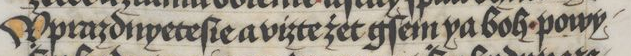Vprazdnyeteſie a vizte żet gſem ya boh.powy¬
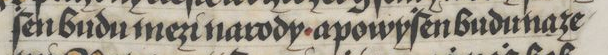ſen budu mezi narody.apowyẛen budu na ze¬
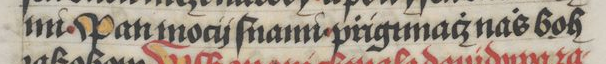mi.Pan mocij ſnami.pṙigímacż naṡ boh
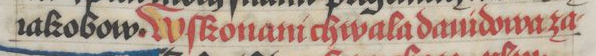iakobow.Wſkonaní chwala dauidowa za¬
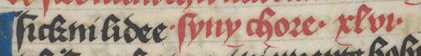ẛicknilidee.ſyny chore.xlvi.
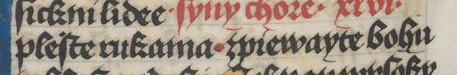pleẛte rukama.zpiewayte bohu
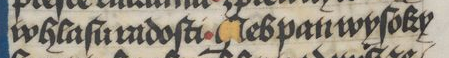w hlaſu radoſti.Neb pan wyſoky
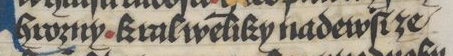hrozny.kral weliky nadewẛí ze¬
